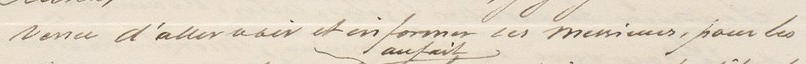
venu d'aller voir et informer ces Messieurs, pour les
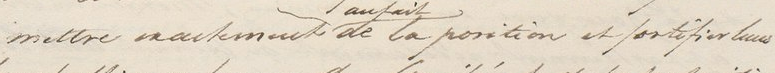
mettre exactement au fait de la position et fortifier leurs
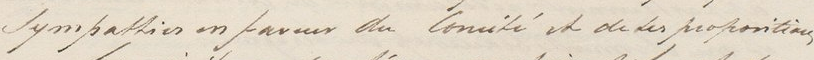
sympathies en faveur du Comité et de ses propositions.
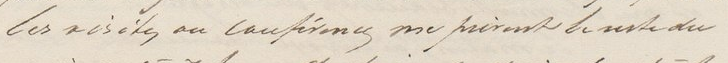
Les visites au conférences me prirent le reste du
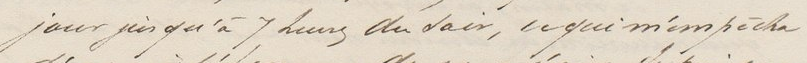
jour jusqu'à 7 heures du soir, ce qui m'empêche
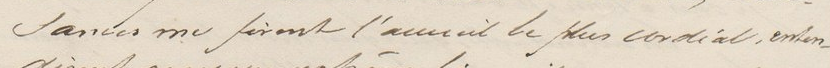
sances me firent l'accueil le plus cordial, enten-
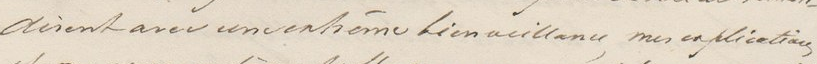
dirent avec une extrême bienveillance, mes aplications,
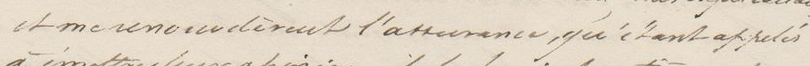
et me renouvelèrent l'assurance, qu'étant appelés
